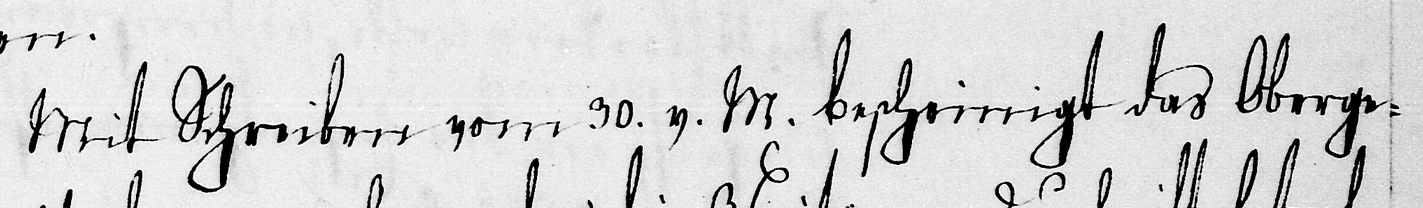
Mit Schreiben vom 30. v. M. bescheinigt das Oberger¬
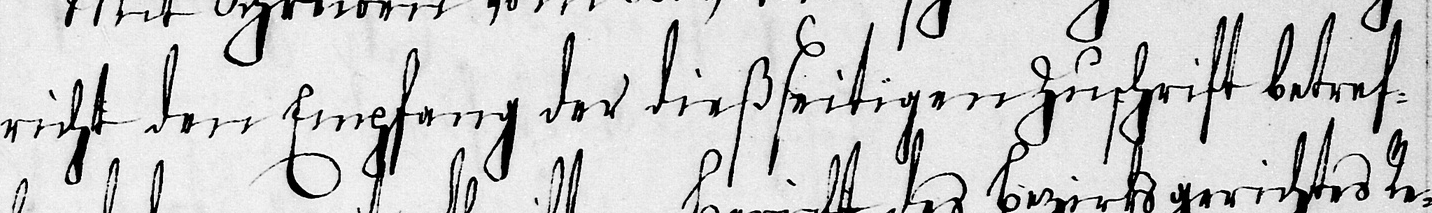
icht den Empfang der dießseitigen Zuschrift betref¬
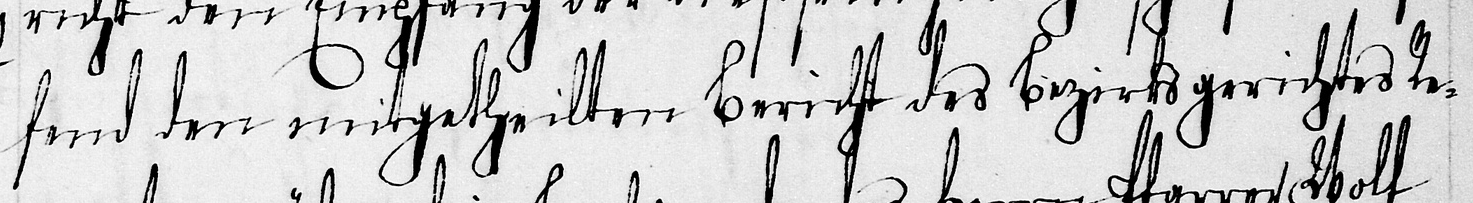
fend den mitgetheilten Bericht des Bezirksgerichtes Re¬
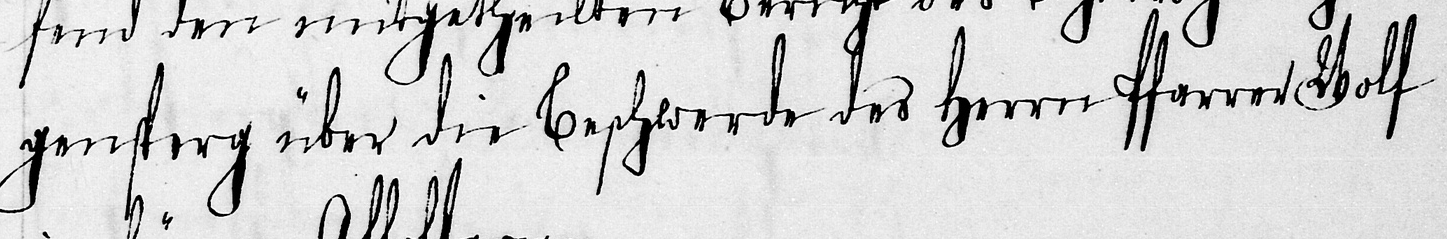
gensperg über die Beschwerde des Herrn Pfarrer Wolf
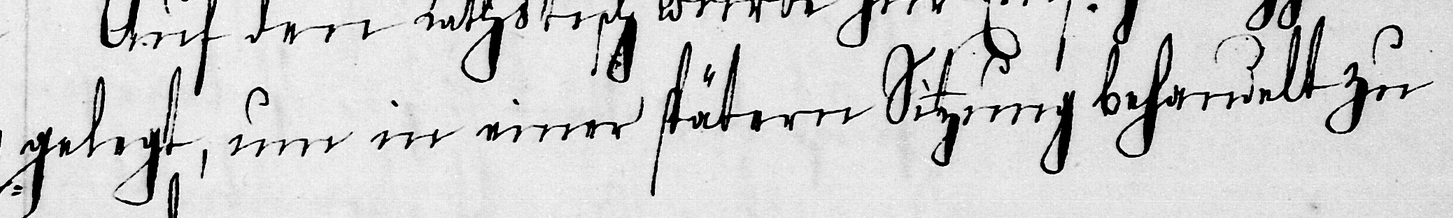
gelegt, um in einer spätern Sitzung behandelt zu
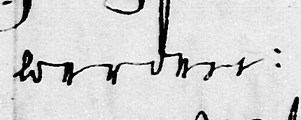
werden:
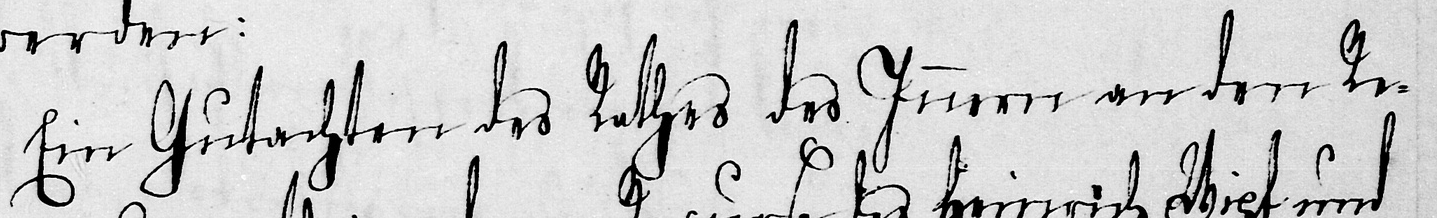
Ein Gutachten des Rathes des Innern an den Re¬
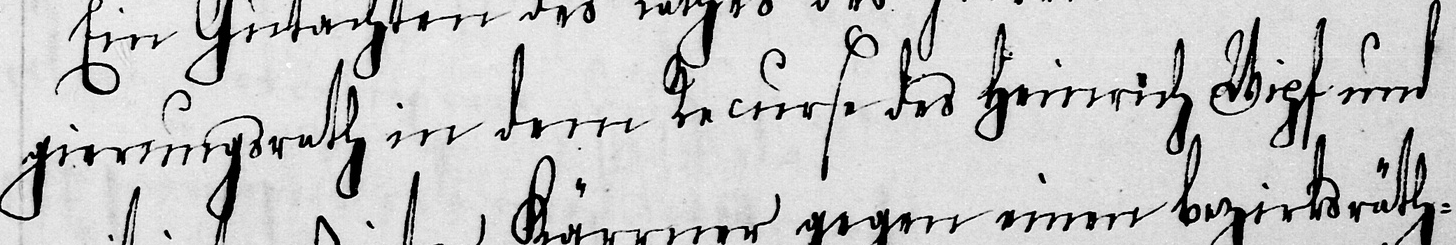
gierungsrath in dem Recurse des Heinrich Wipf und
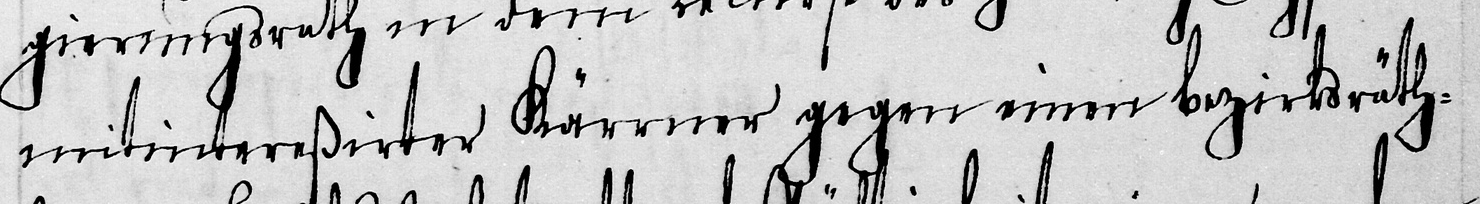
mitintereßirter Kärrner gegen einen bezirksräth¬
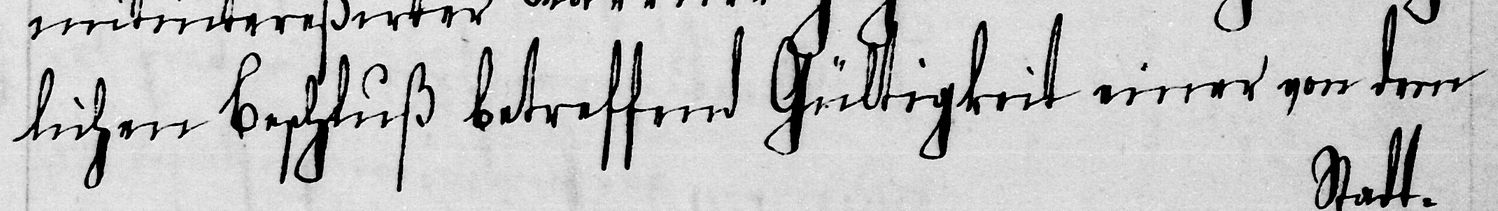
lichen Beschluß betreffend Gültigkeit einer von dem
